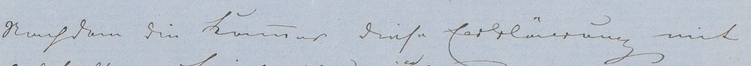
Nachdem die Kammer diese Erklärung mit
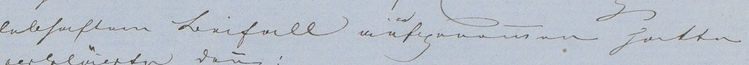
lebhaftem Beifall aufgenommen hatte
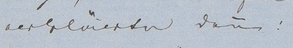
erklärte dann:
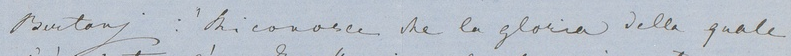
Bertanj : Riconosce che la gloria della quale
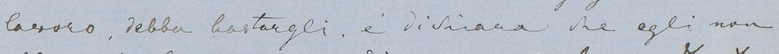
lavoro, debba bastargli e dichiara che egli non
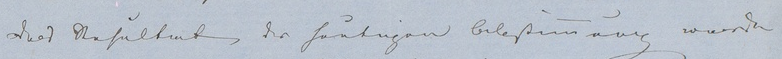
Das Resultat der heutigen Abstimmung werde
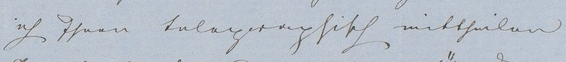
ich Ihnen telegraphisch mittheilen.
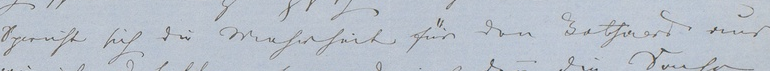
Spricht sich die Mehrheit für den Gothard aus
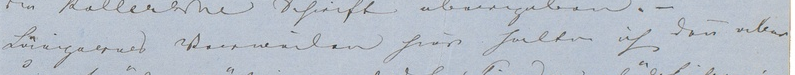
Längeres Verweilen hier halte ich dann aber
